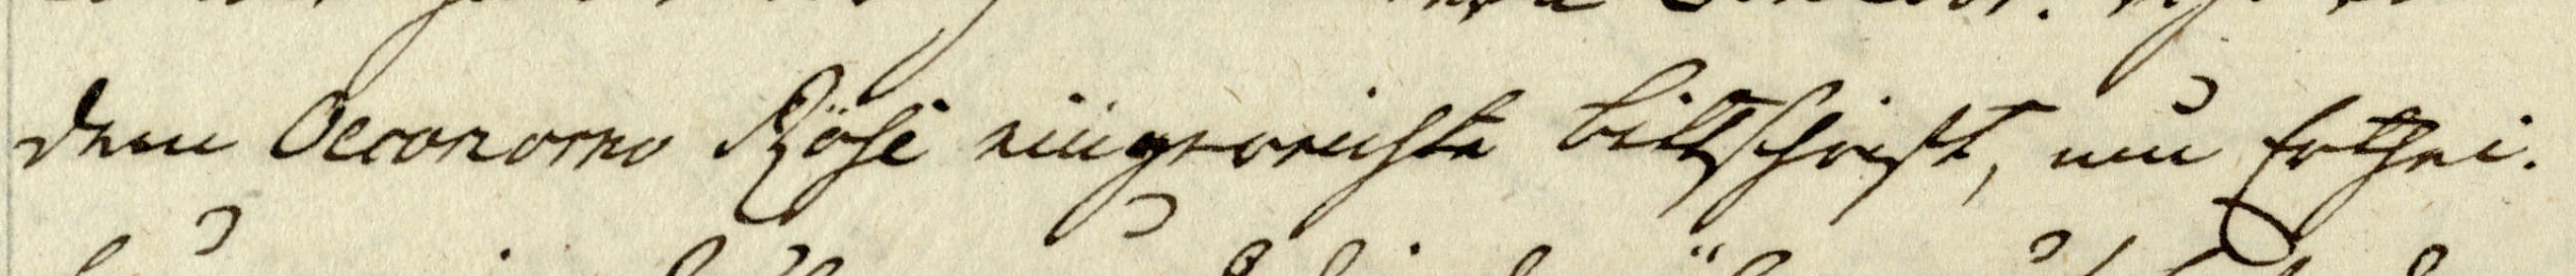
dem Oeconomo Röse eingereichte Bittschrift, um Erthei¬
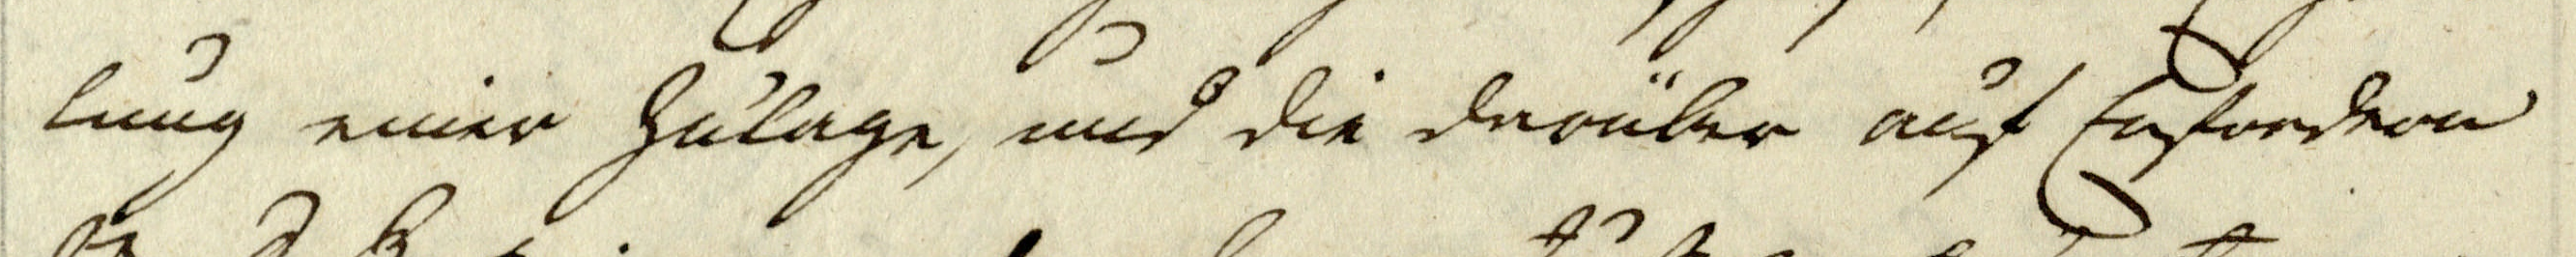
lung einer Zulage, und die darüber auf Erfordern
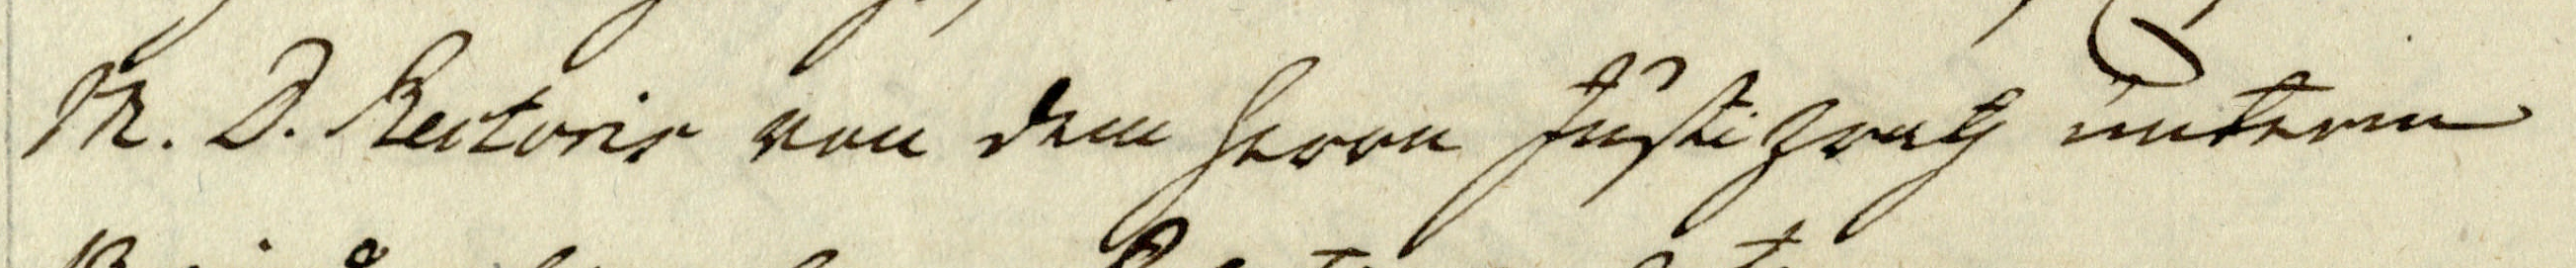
M. D. Rectoris von dem Herrn Justizrath unterm
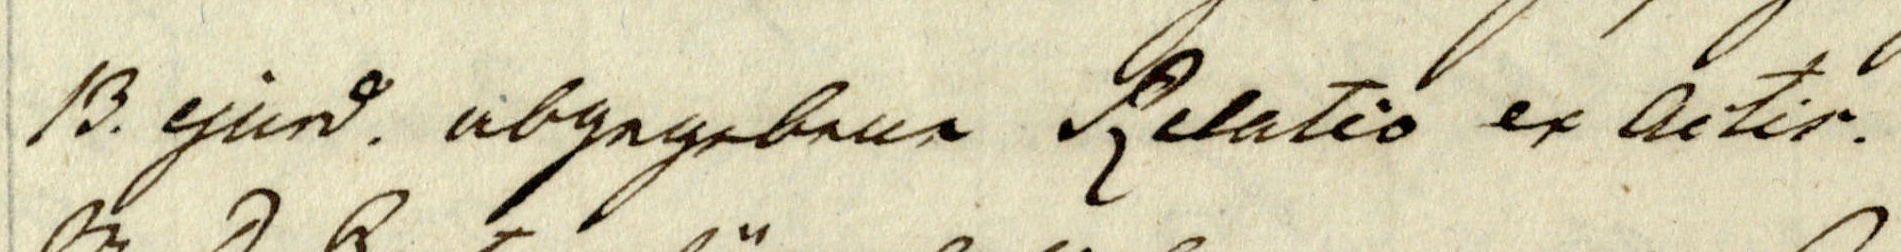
13. ejusd. abgegebene Relatio ex Actis.
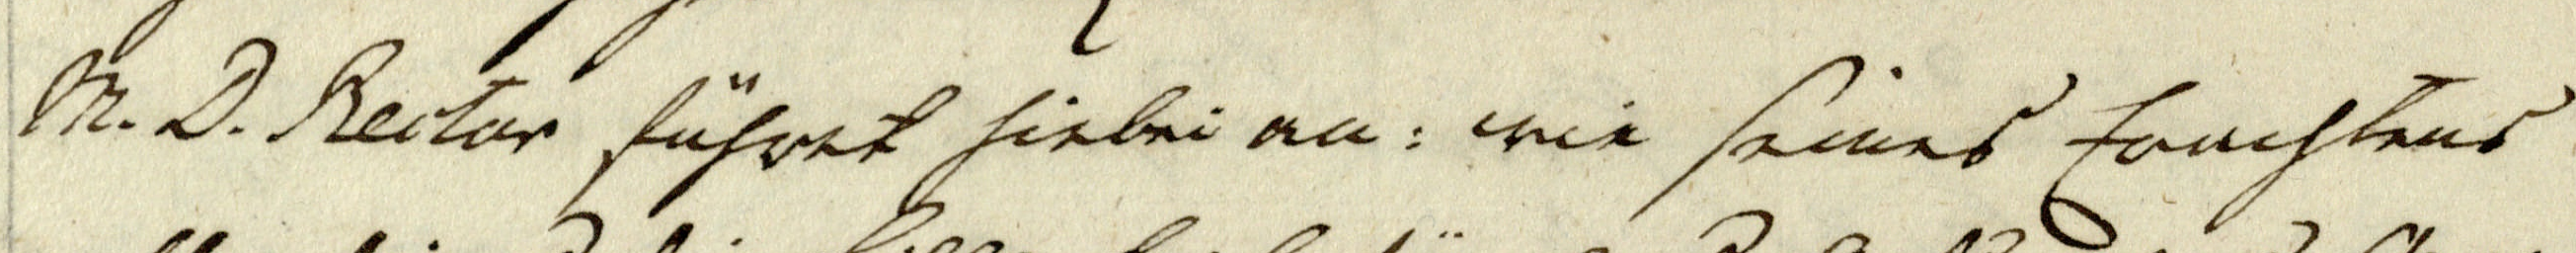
M. D. Rector führet hiebei an: wie seines Erachtens
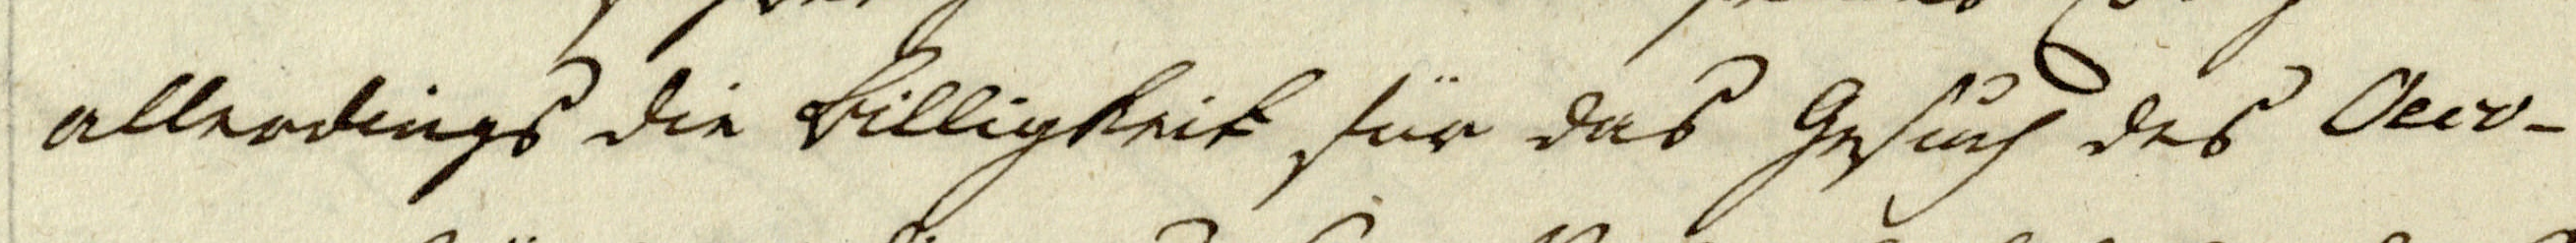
allerdings die Billigkeit für das Gesuch des Oeco¬
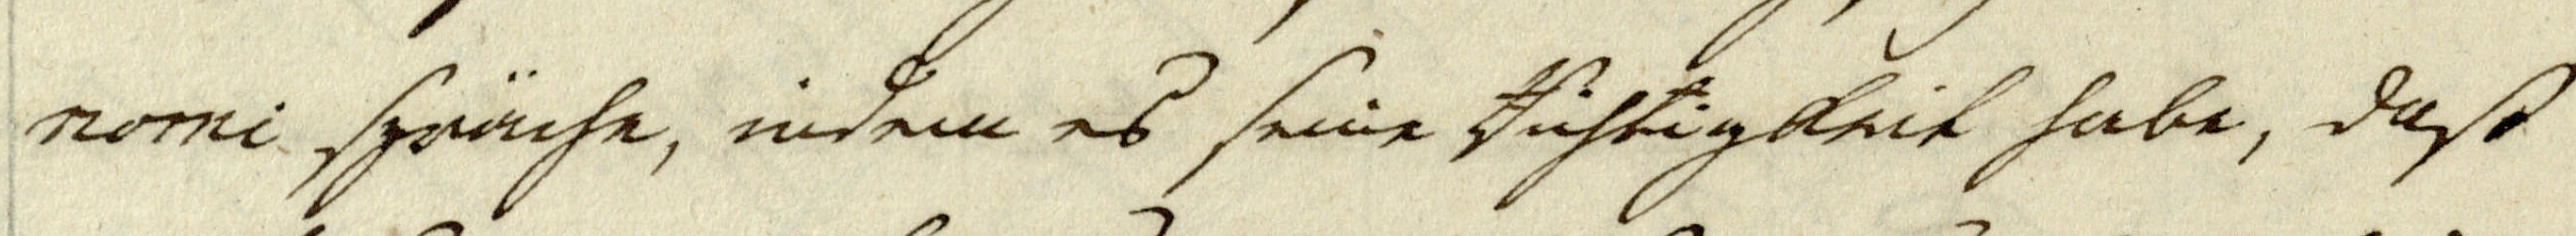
nomi spräche, indem es seine Richtigkeit habe, daß
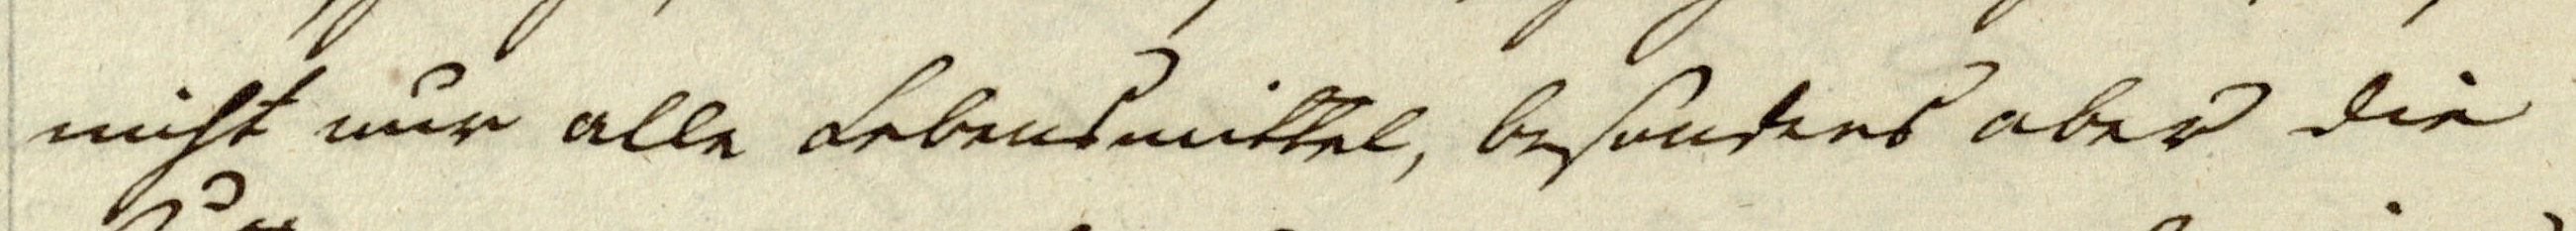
nicht nur alle Lebensmittel, besonders aber die
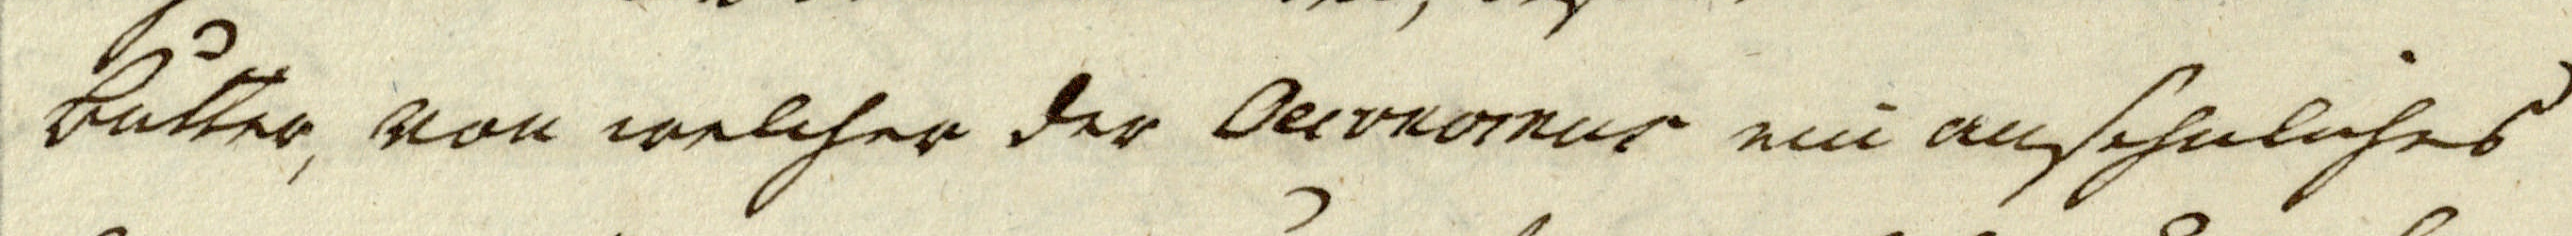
Butter von welcher der Oeconomus ein ansehnliches
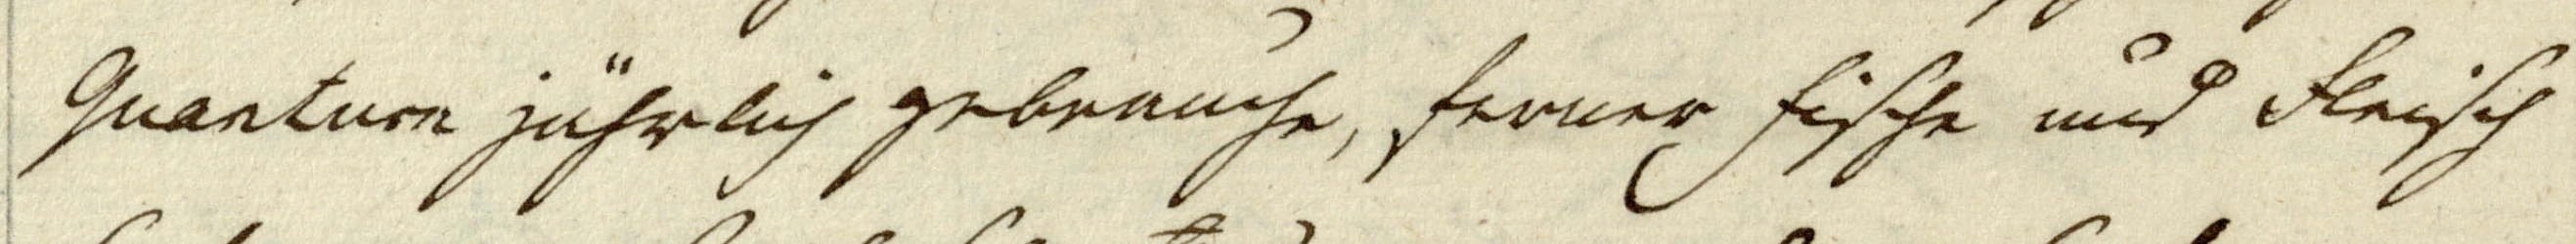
Quantum jährlich gebrauche, ferner Fische und Fleisch
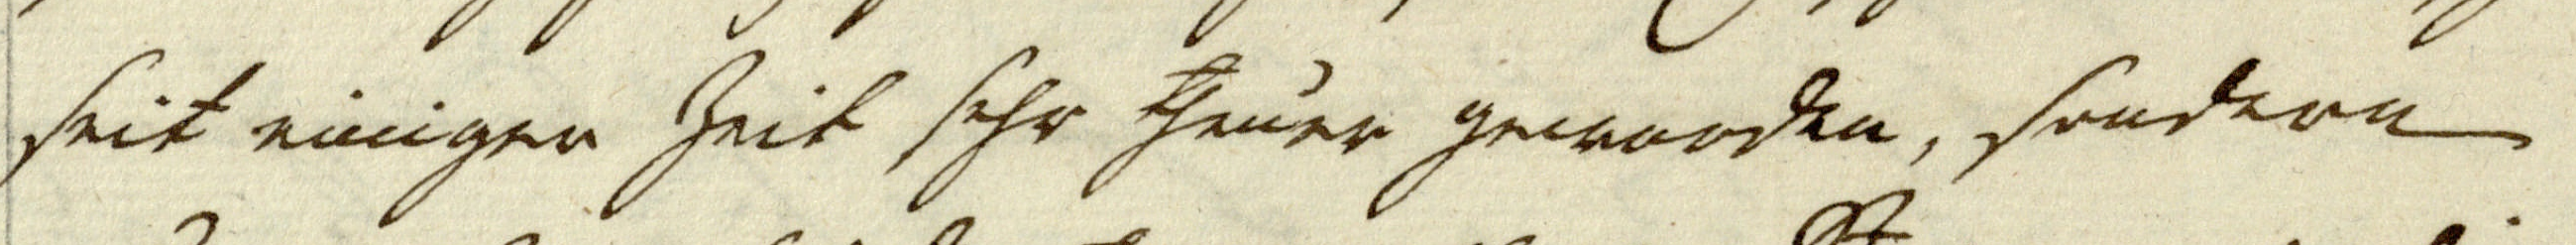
seit einiger Zeit sehr theuer geworden, sondern
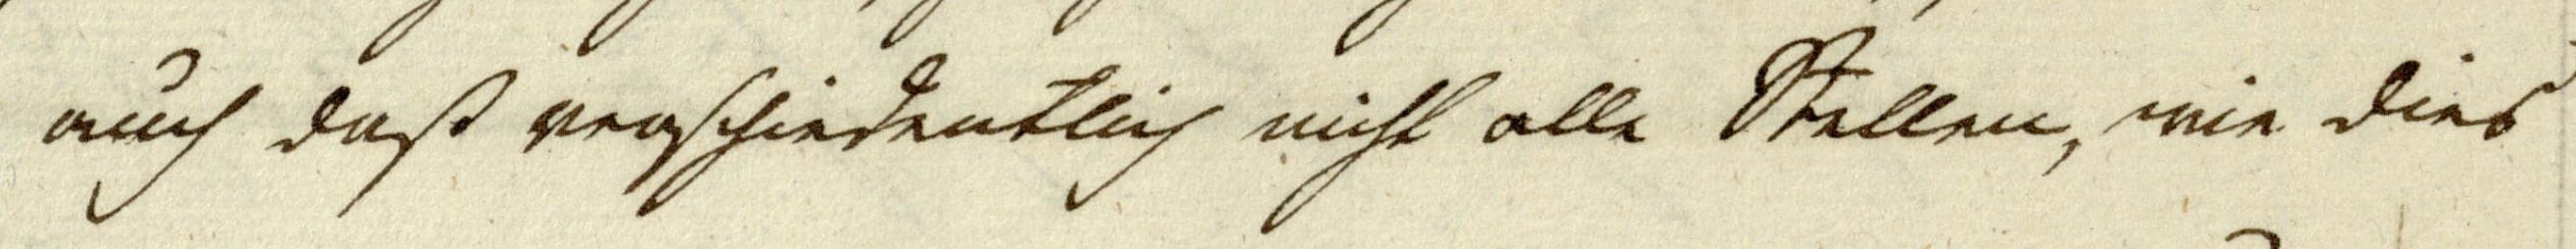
auch daß verschiedentlich nicht alle Stellen, wie dies
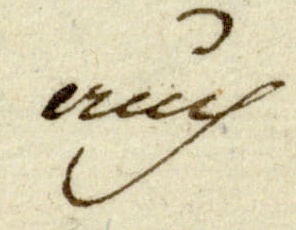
auch
